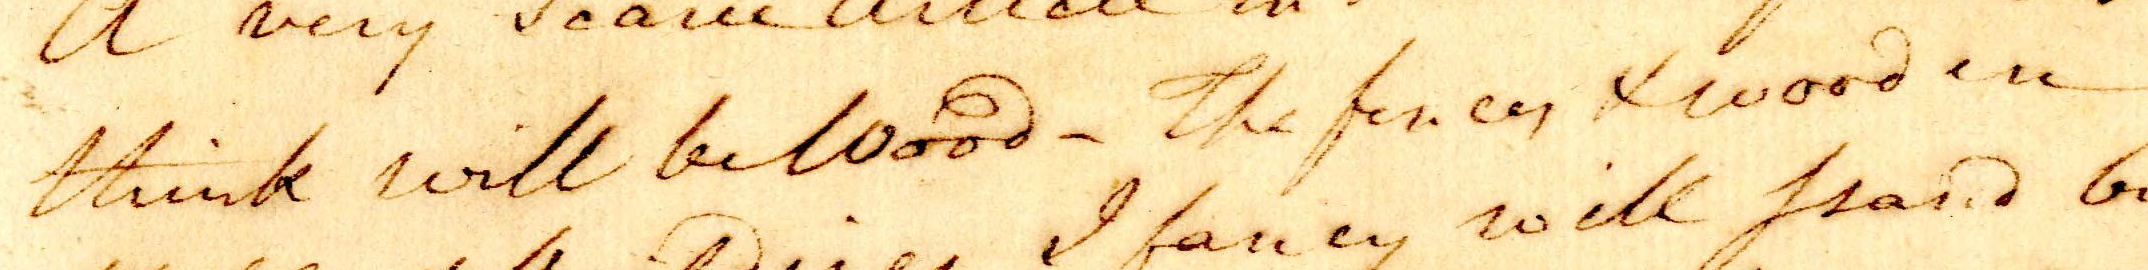think will be Wood- The fences & wooden
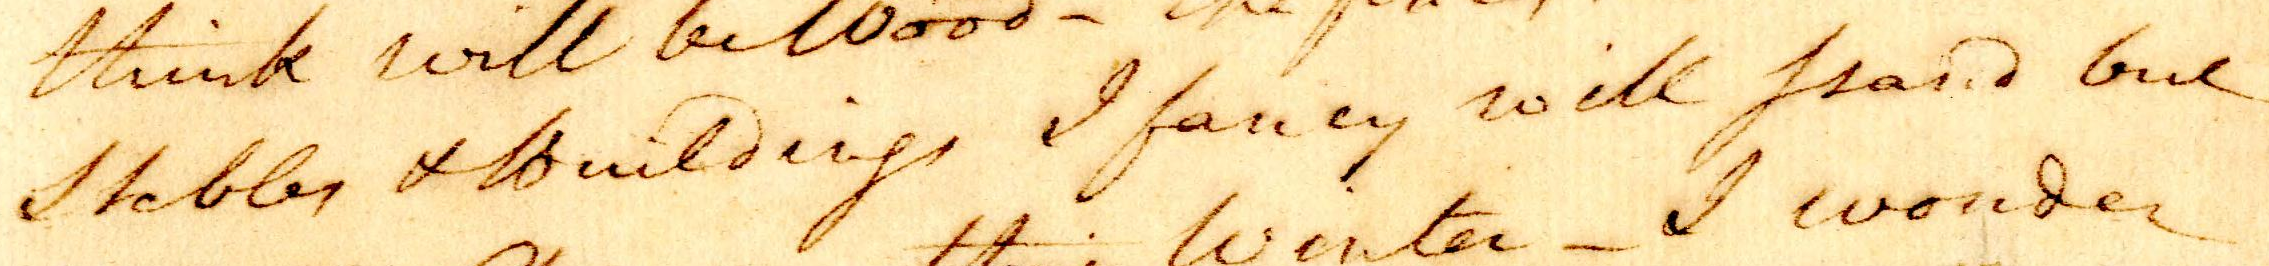Stables & Buildings I fancy will stand but
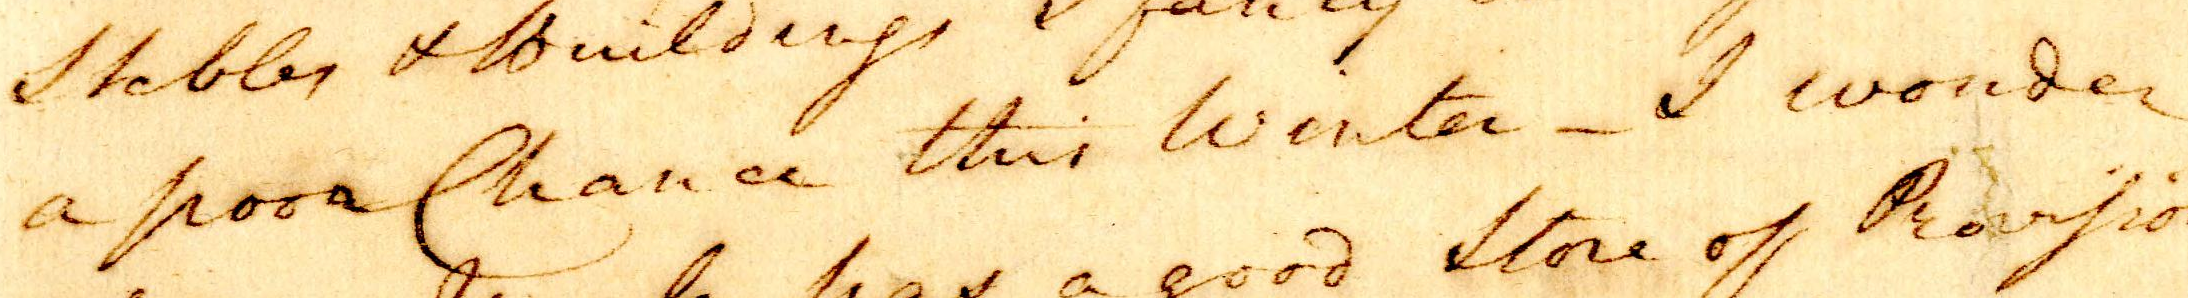a poor Chance this winter- I wonder
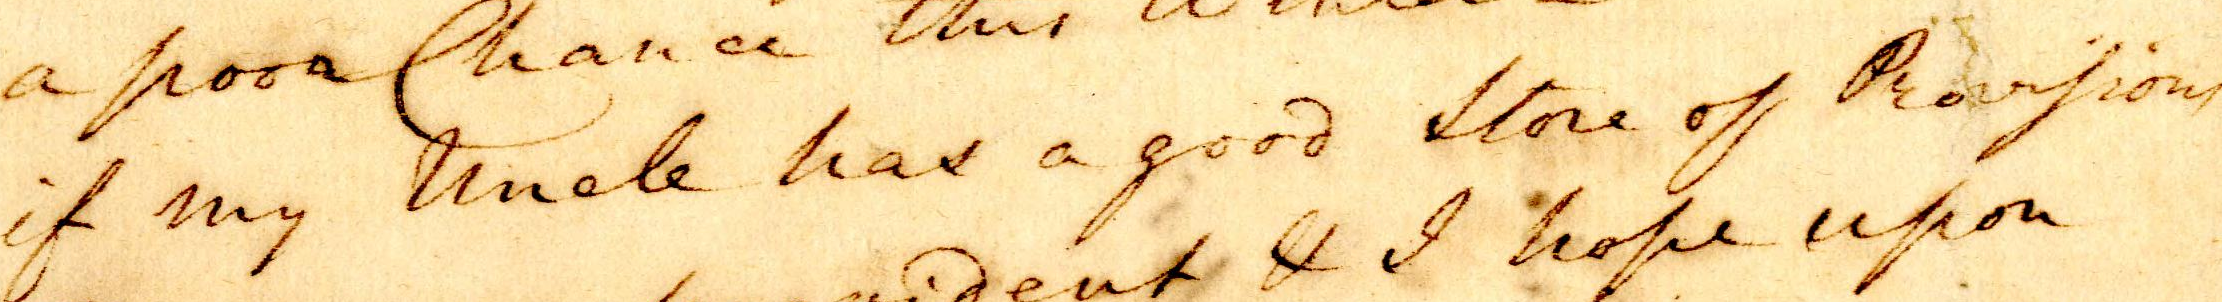if my Uncle has a good Store of Provisions
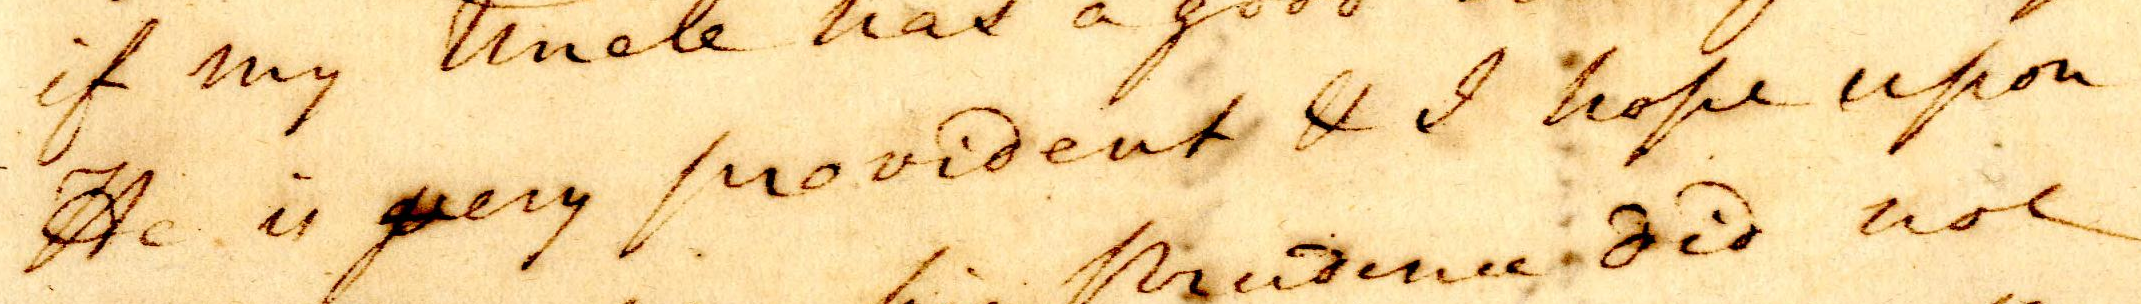He is very provident & I hope upon
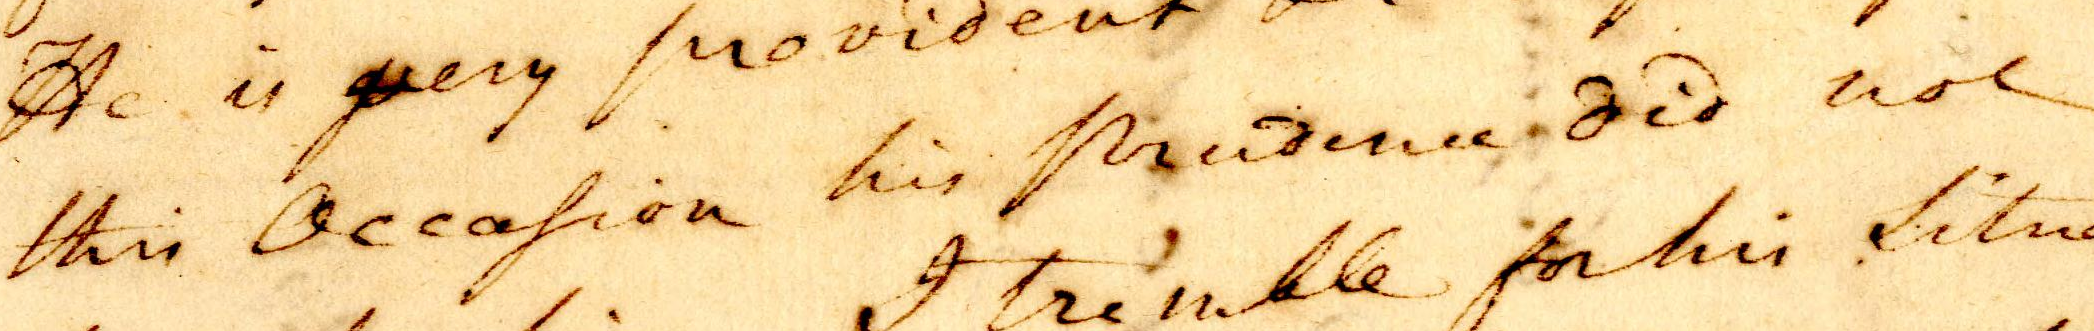this Occasion his prudence did not
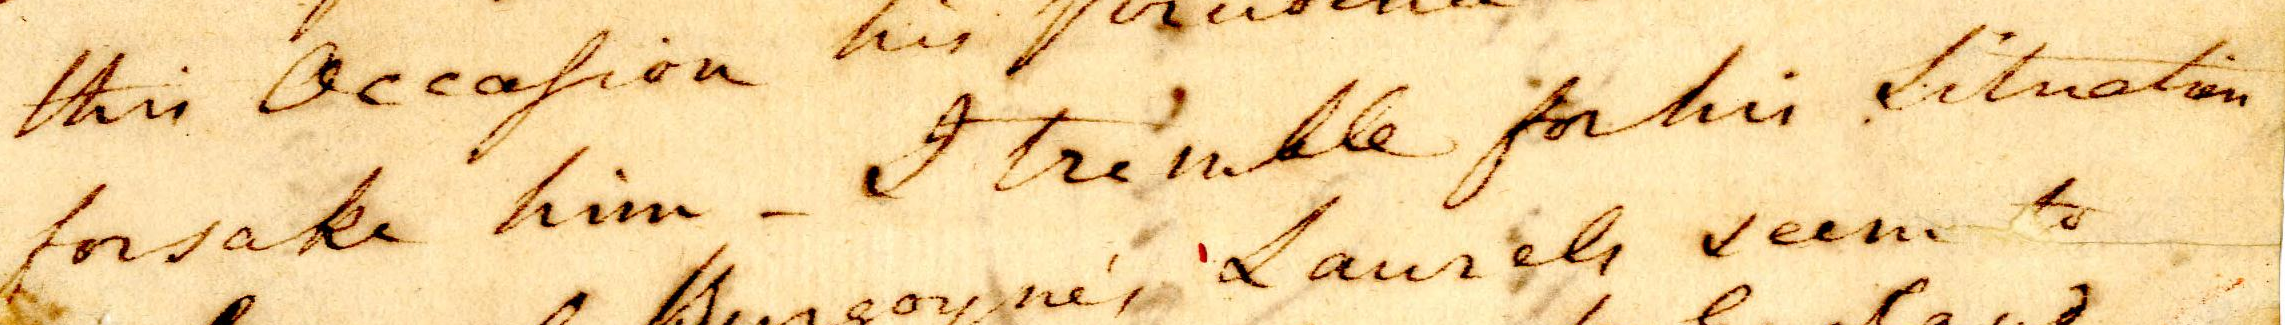forsake him- I tremble for his Situation
